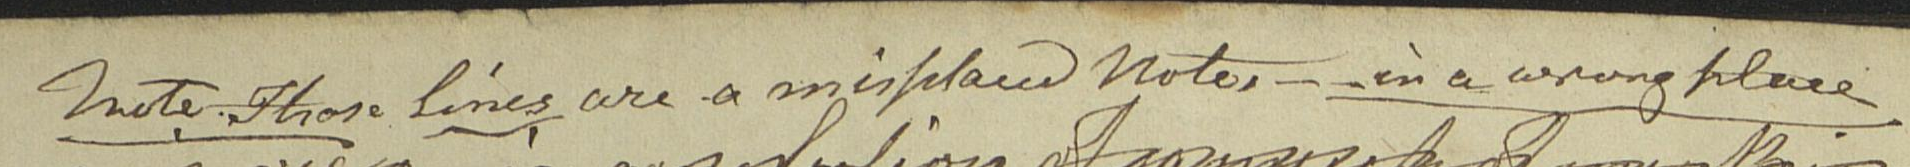Note those lines are a misplaced note in a wrong place
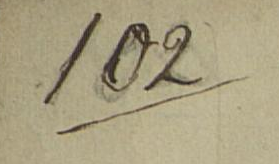102
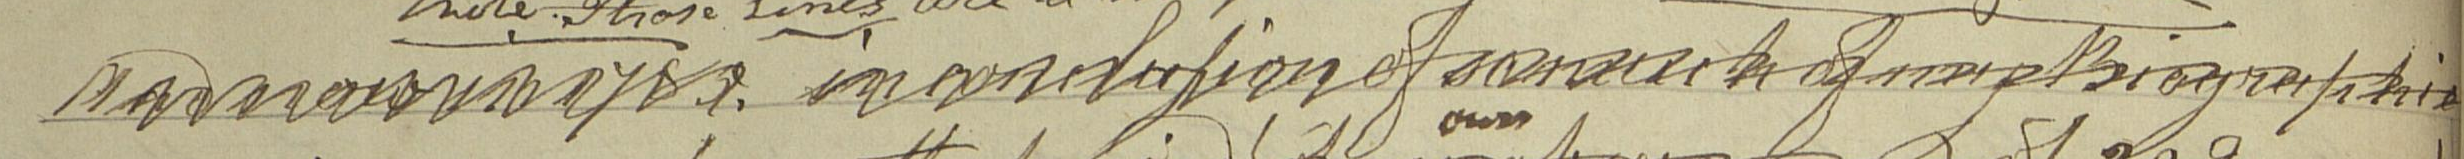[and now in 1785 in conclusion of so much of my Biographic-
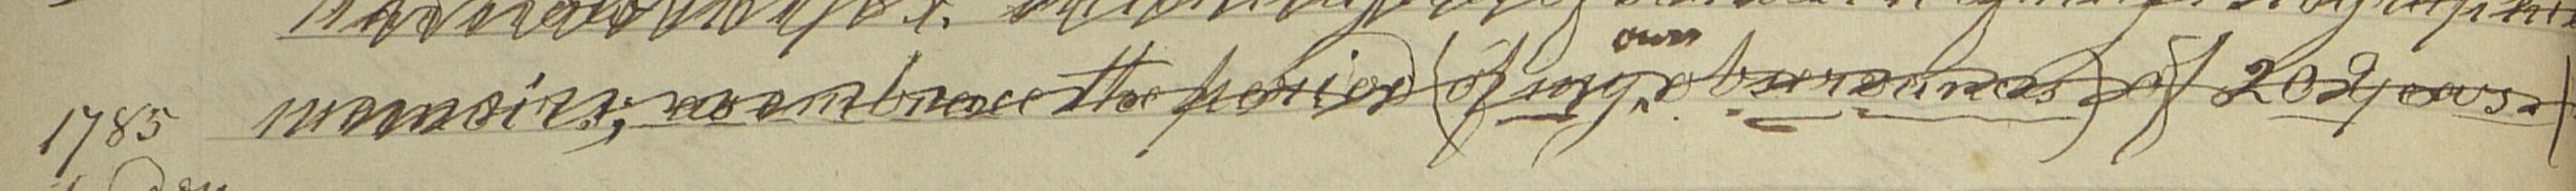1785 [memoirs; as embrace the period (of my ^ observances) of 20 Years]
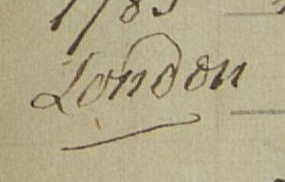London
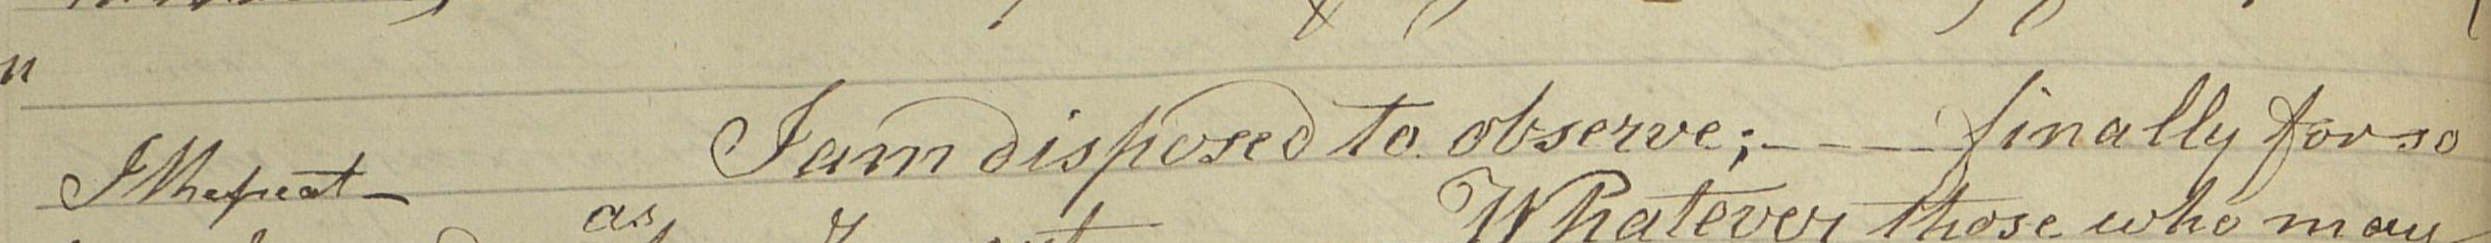I Respect I am disposed to observe; finally for so
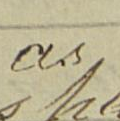as
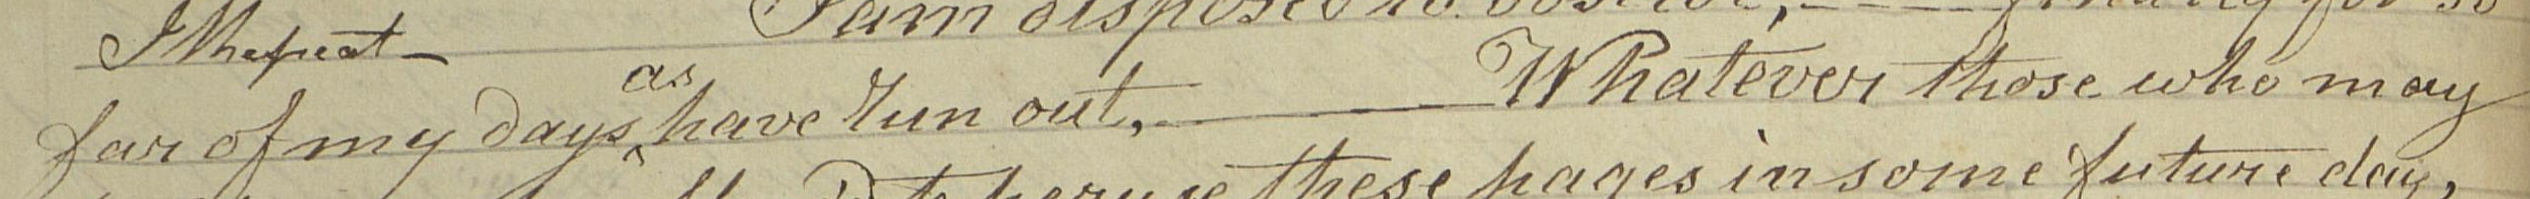far of my days ^ have run out, Whatever those who may
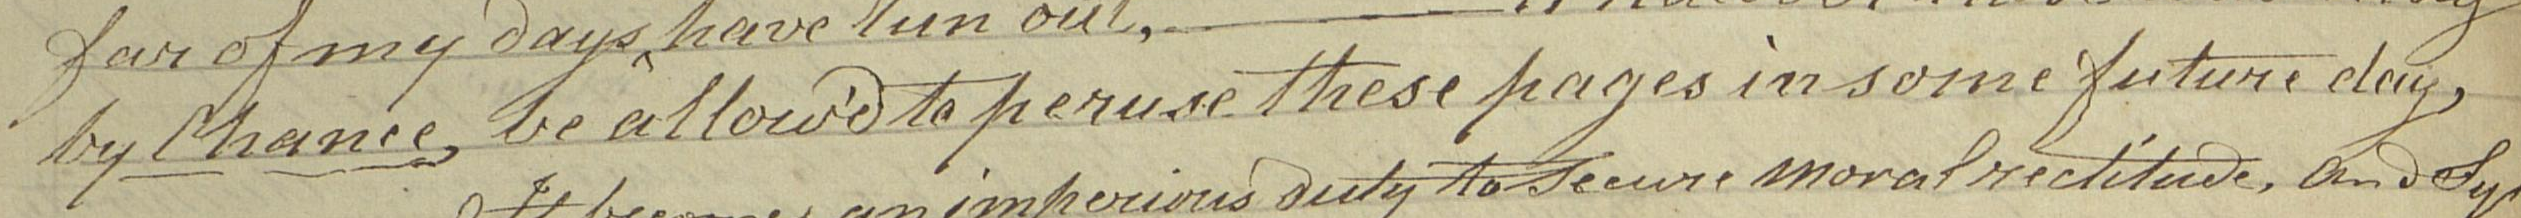by Chance be allow'd to peruse these pages in some future day,
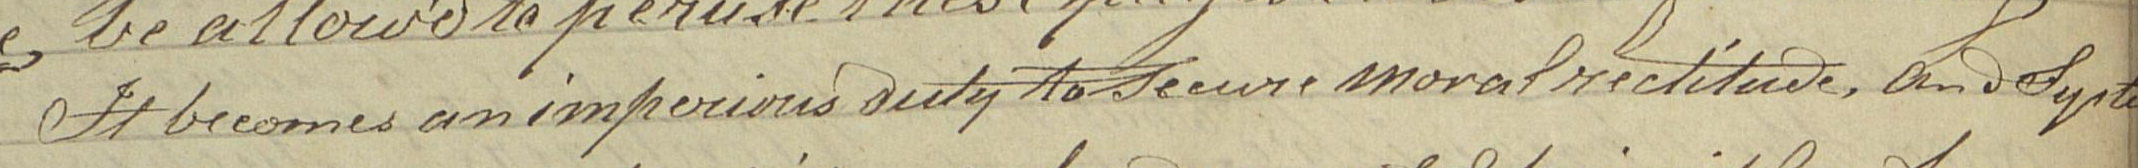It becomes an imperious duty to Secure moral rectitude, And Syst-
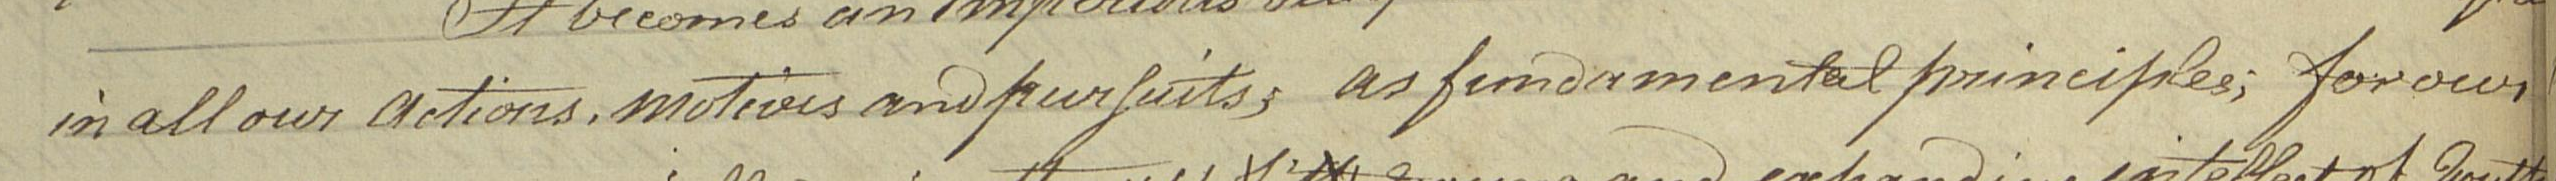in all our Actions motives and pursuits, as fundamental principles; for our
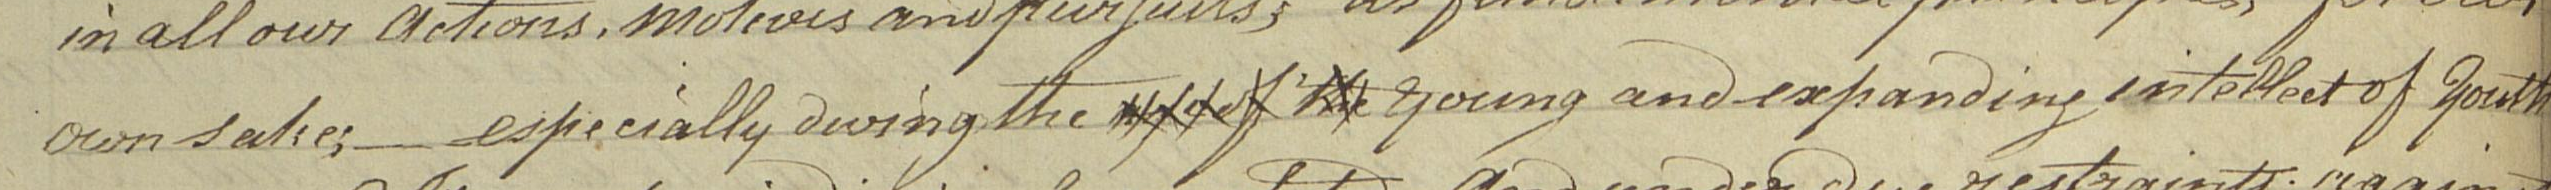on sake; especially during the [one of the] Young and expanding intellect of Youth
